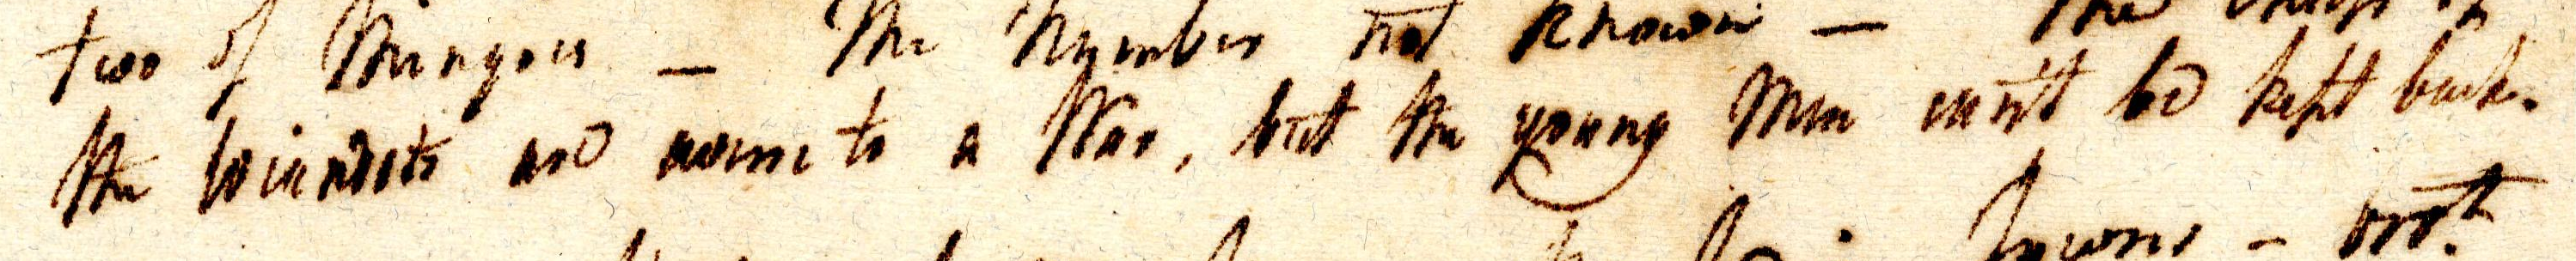the Wiandots are averse to a War, but the young men can't be kept back.
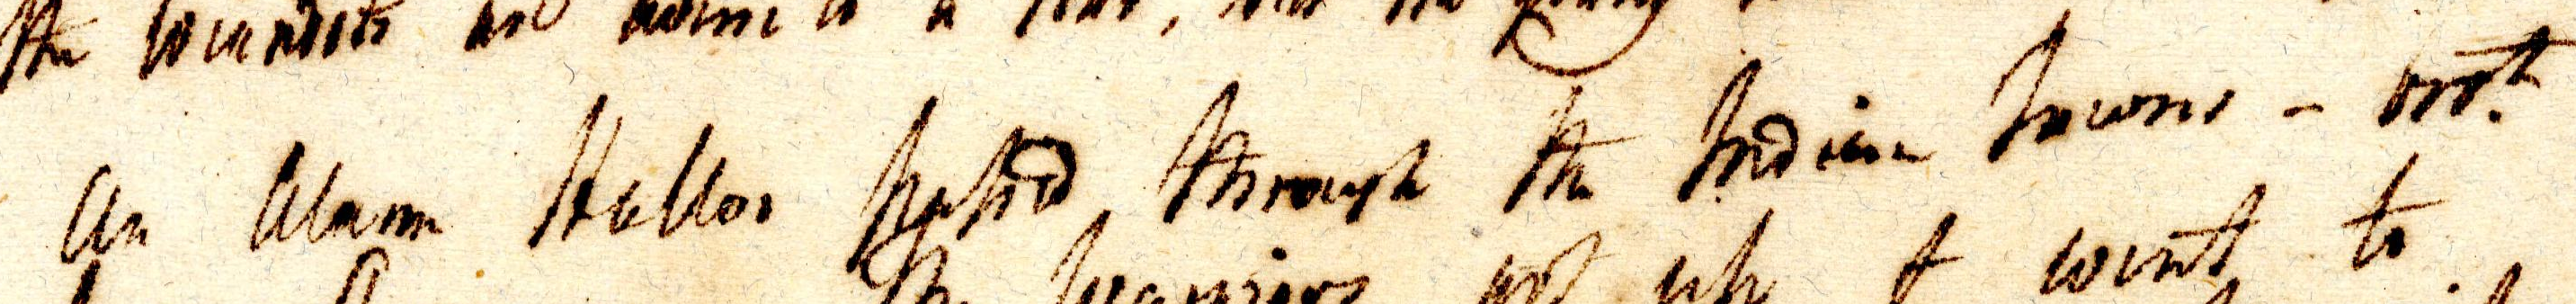An Alarm Halloo passed through the Indian Towns - orr^t
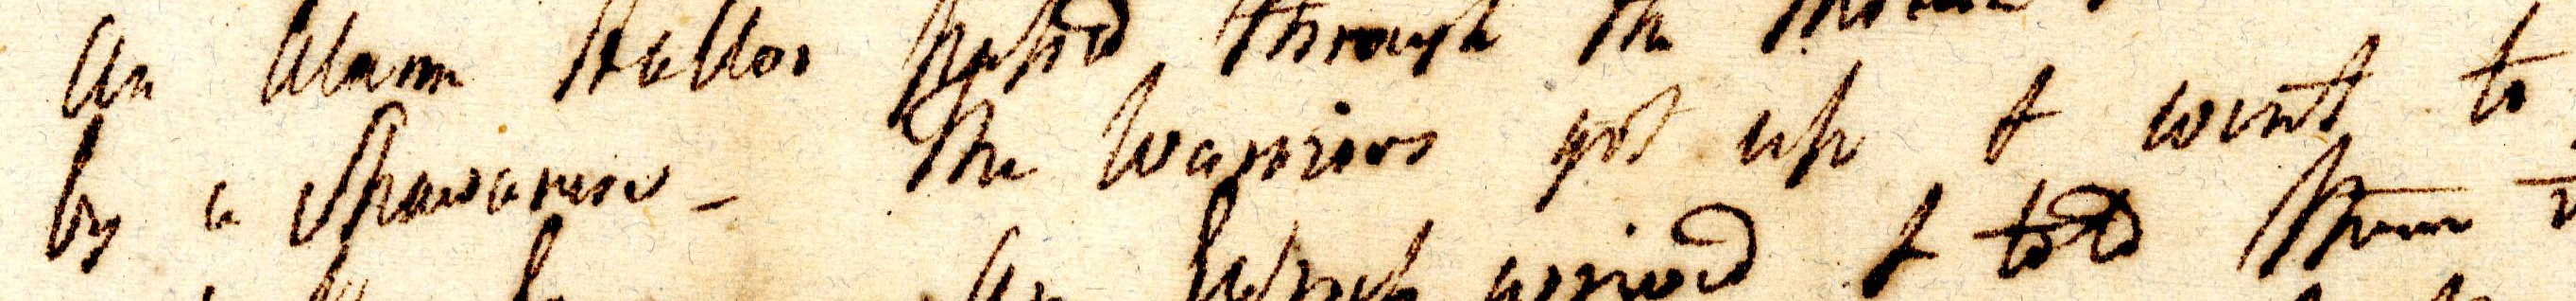by a Shawanese- The Warriors got up & went to
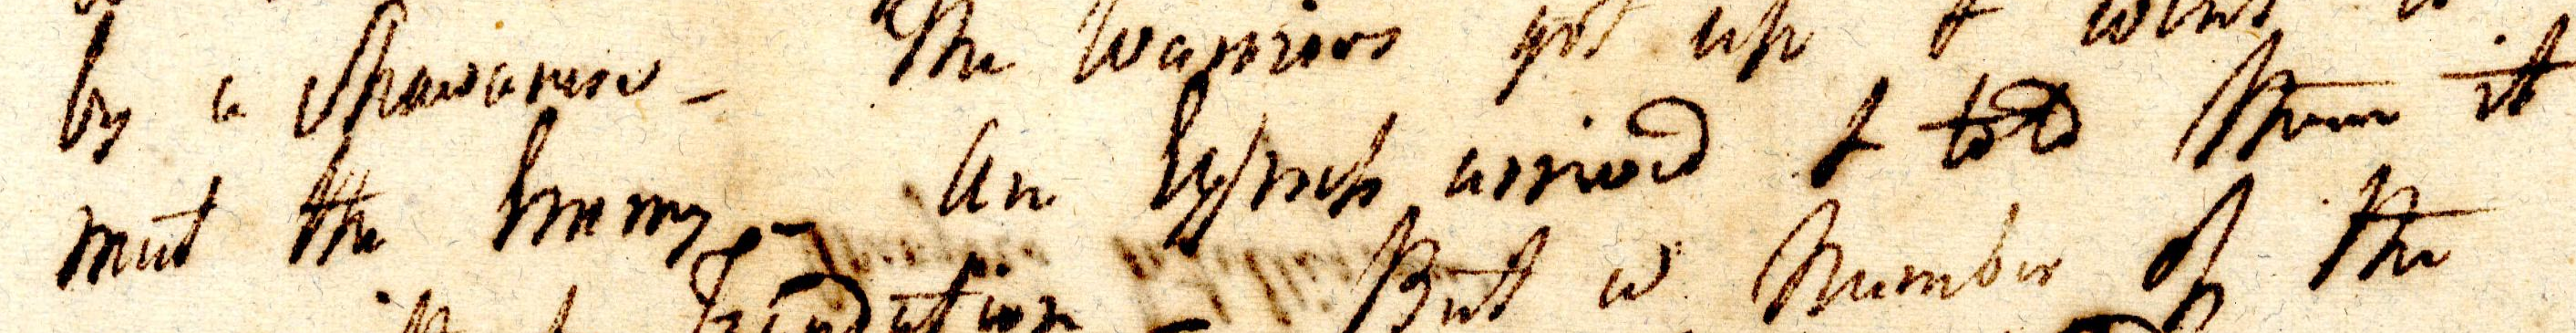meet the Enemy.- An Eyness arrived & told them it
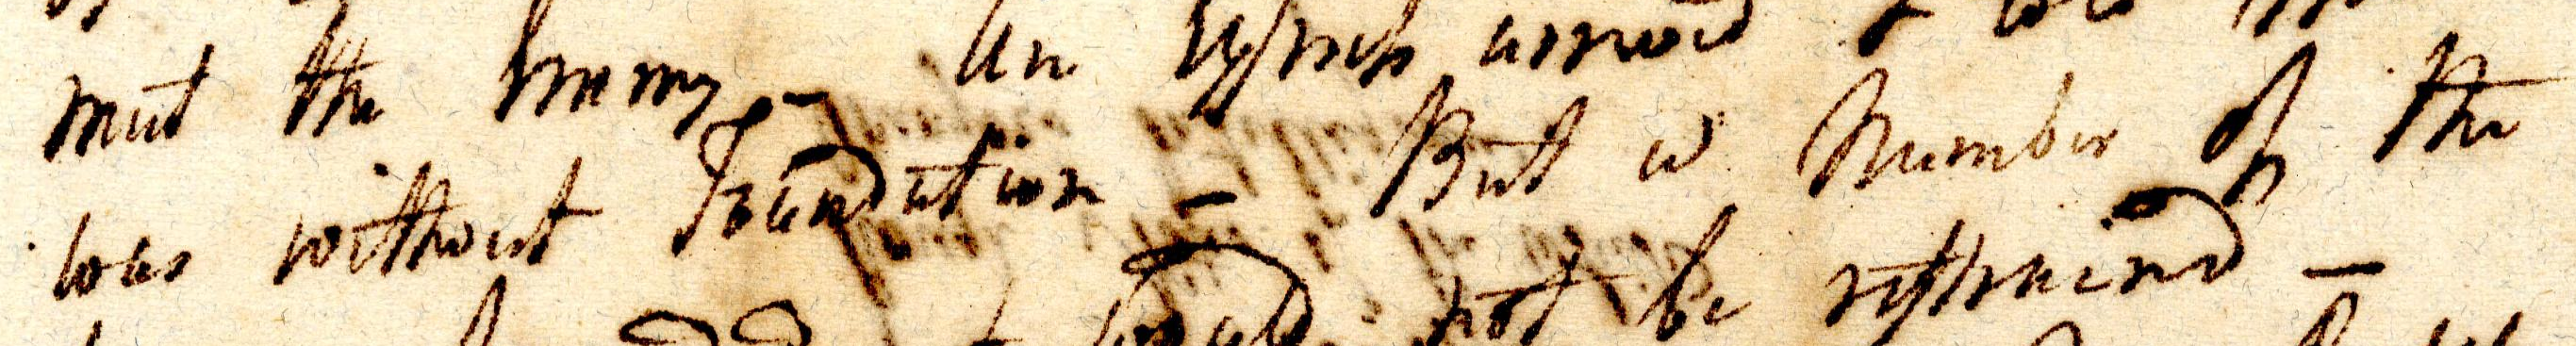was without Foundation- But a Number of the
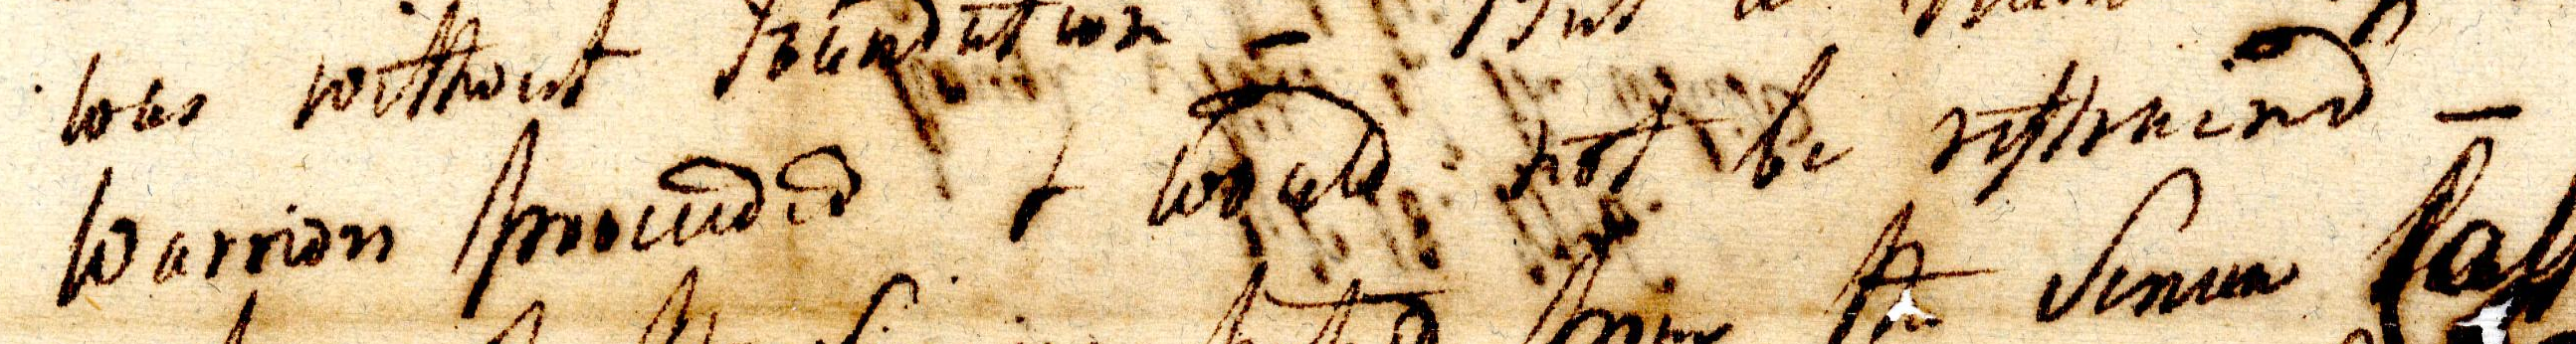warriors proceeded & would not be restrained-
